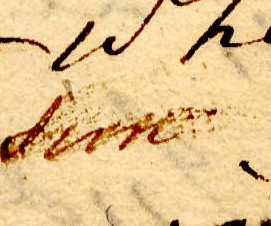done
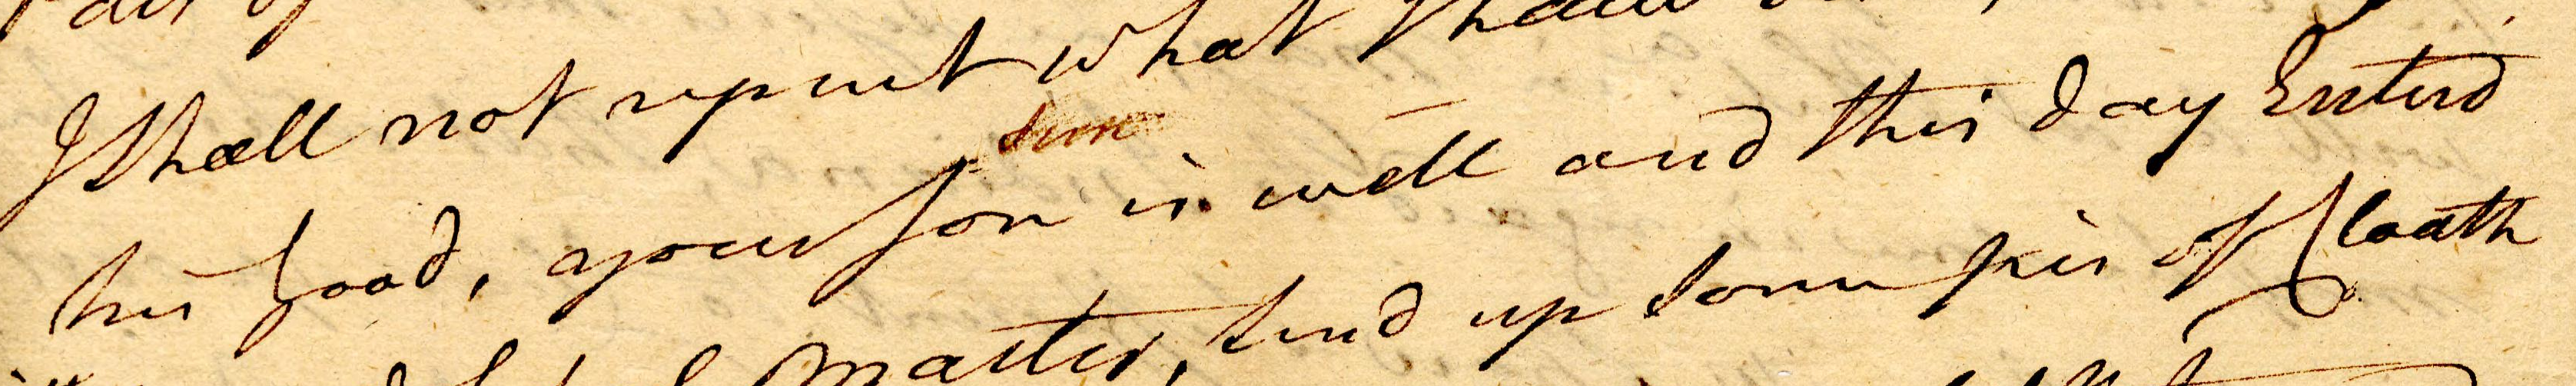his good, you son in well and this day Enterd
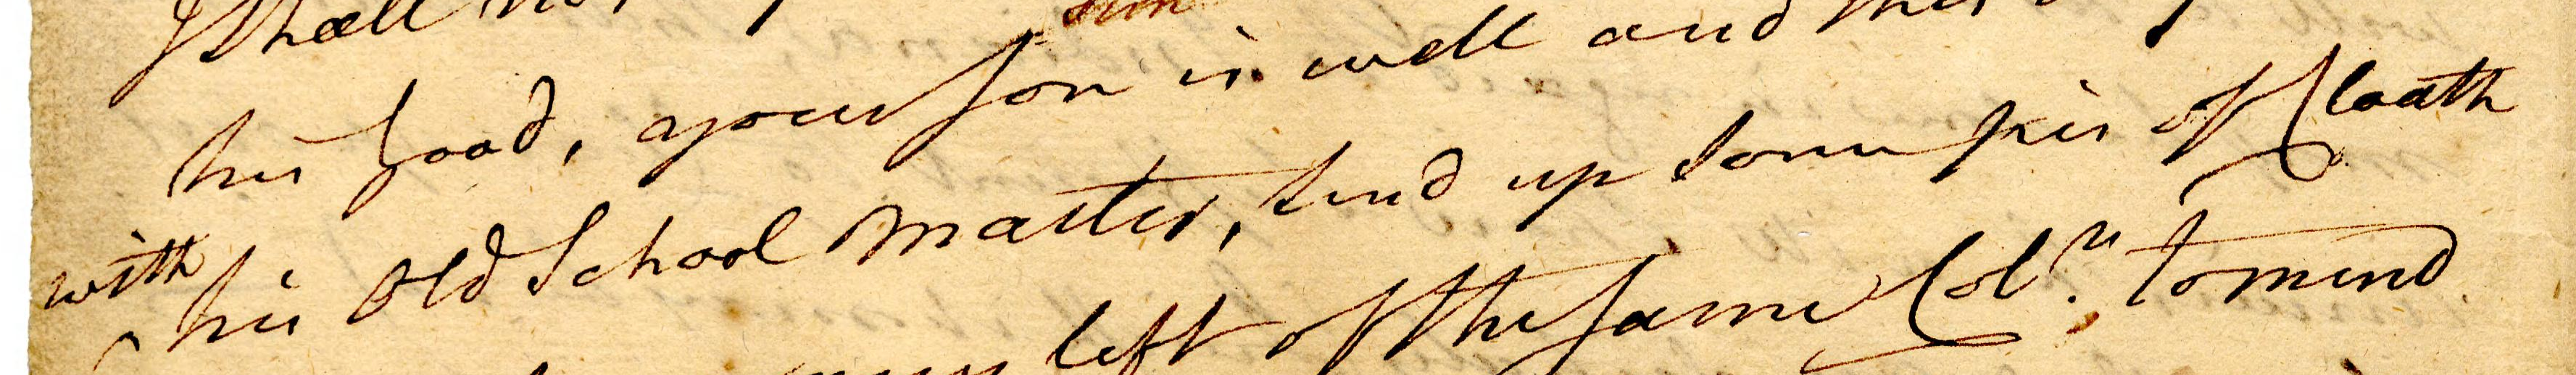with his Old School matter, send up some pis of Cloath
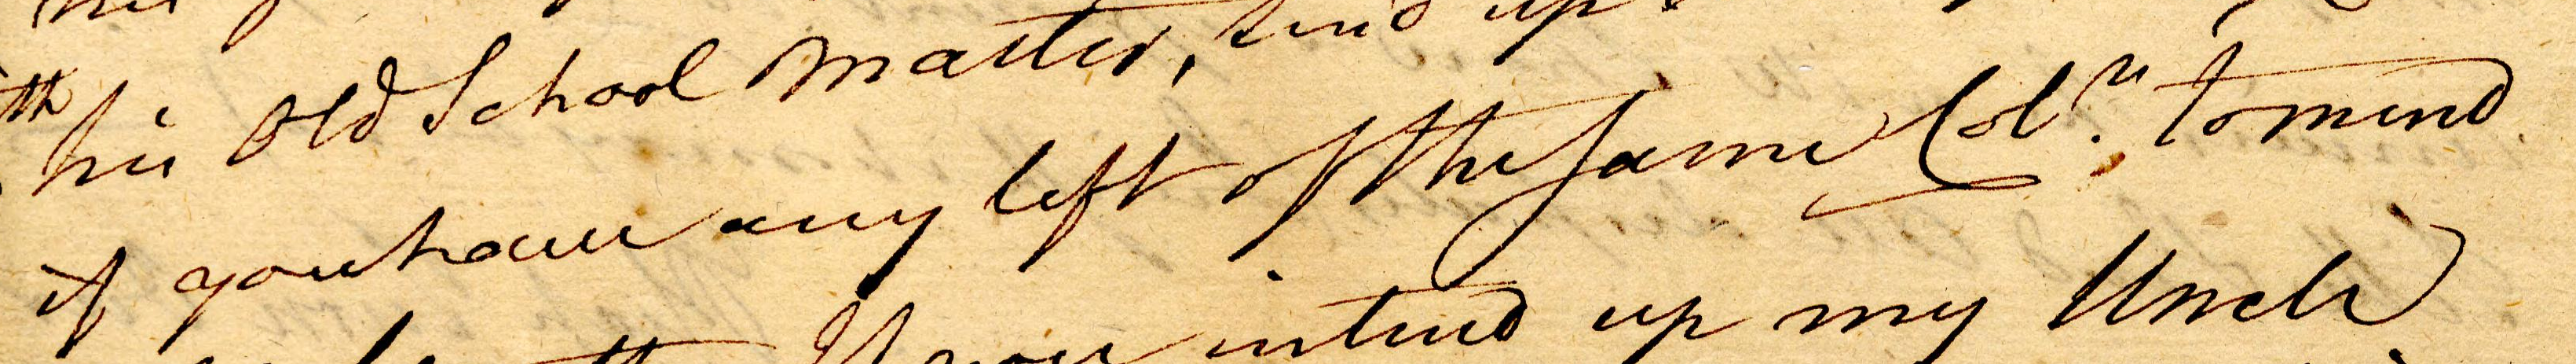if you have very left of the same Col^or. to mend
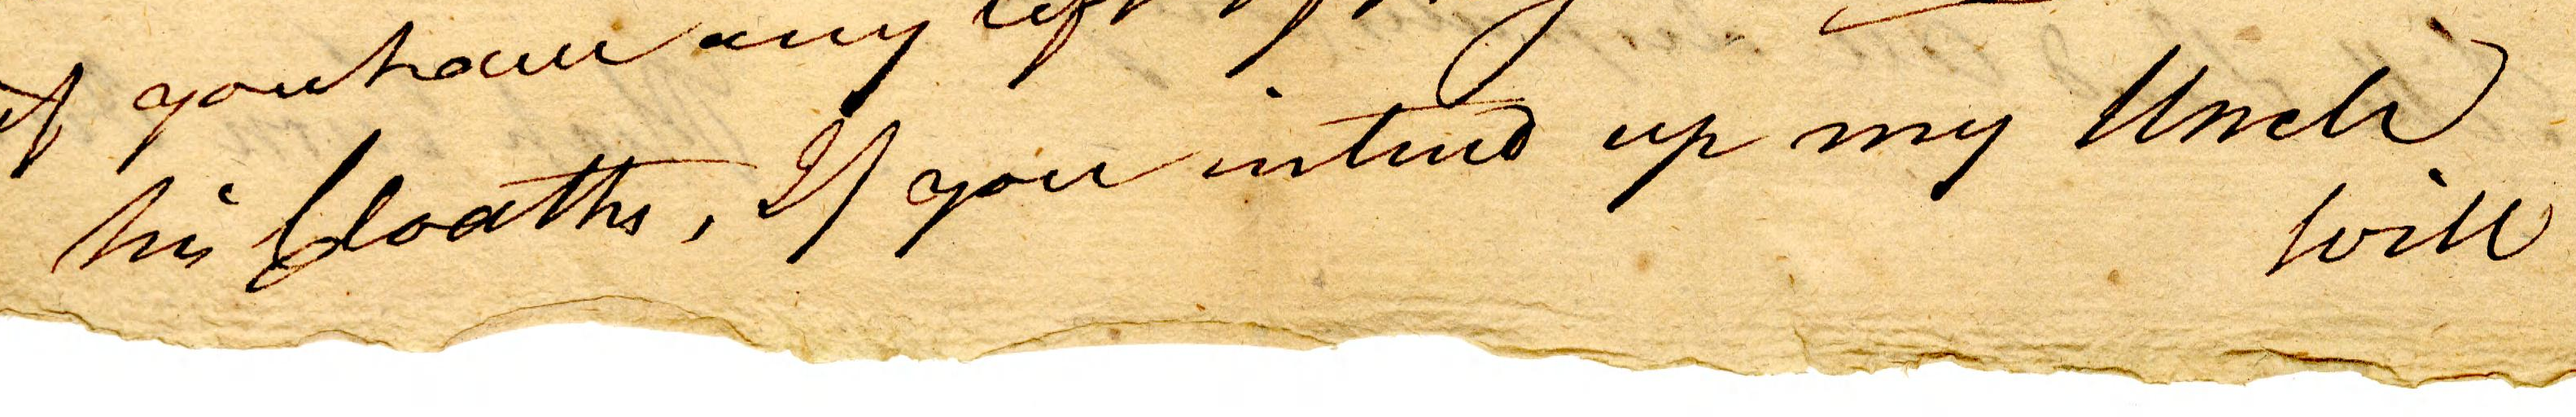his Cloaths, If you intend up my Uncle
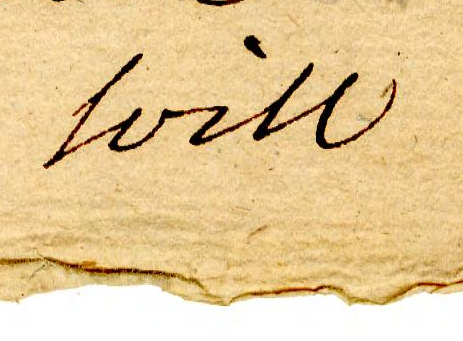will
